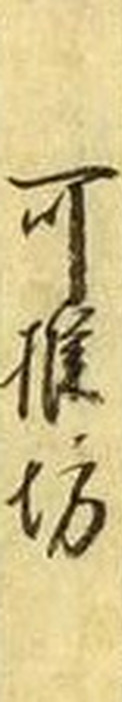可推坊
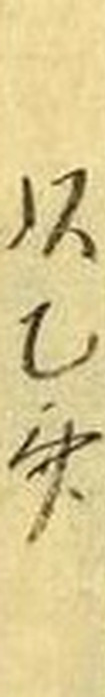以乙斎
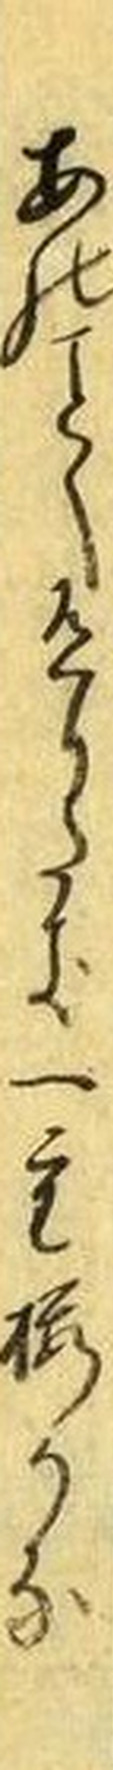あのことく有りたき一重桜かな

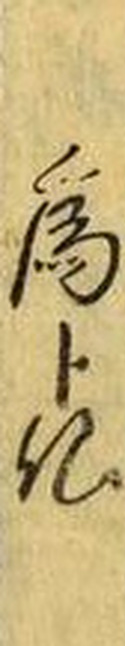為卜仙
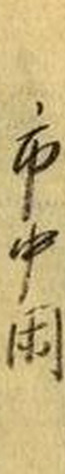市中閑
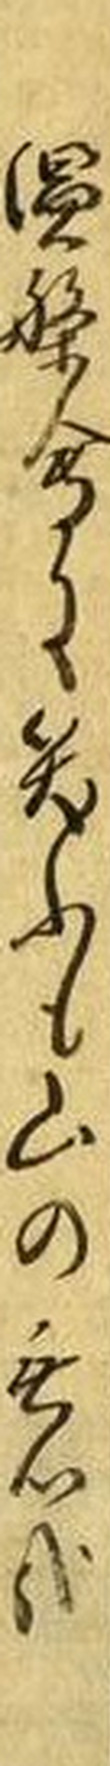涅槃会に笑ふも山の無心哉
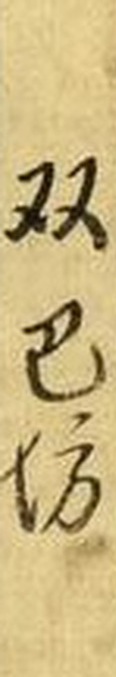双巴坊
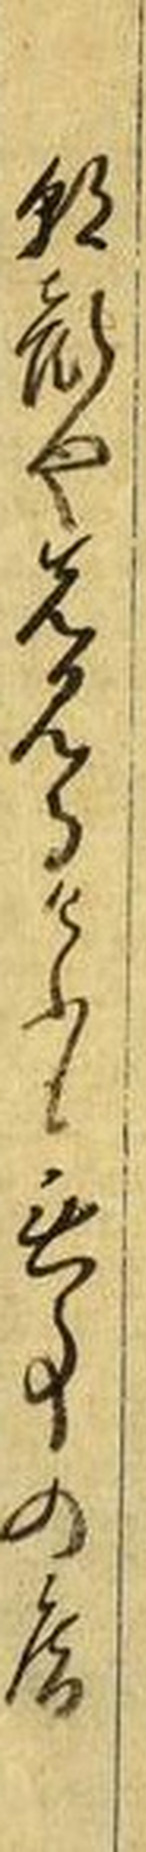朝顔や先見るけふも無事の庵
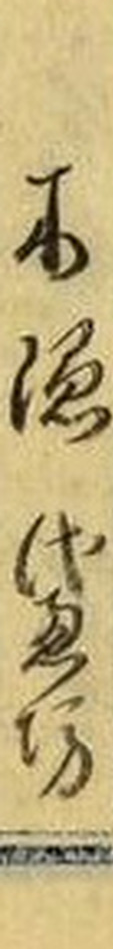木隠代恵坊
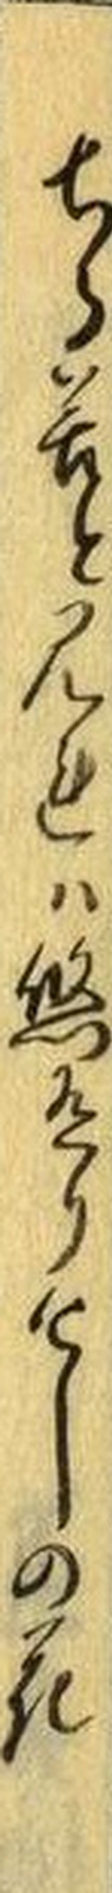ちる筈と見れは悠有りけしの花
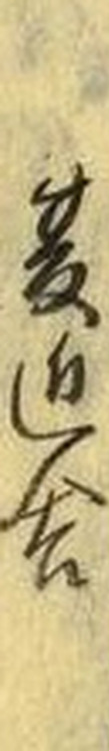夏近舎
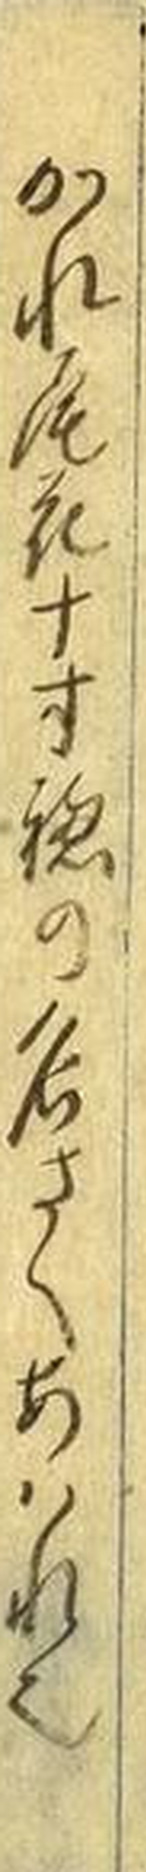かれ尾花十寸穂の名さへあはれ也
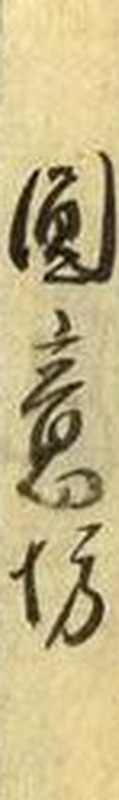円意坊
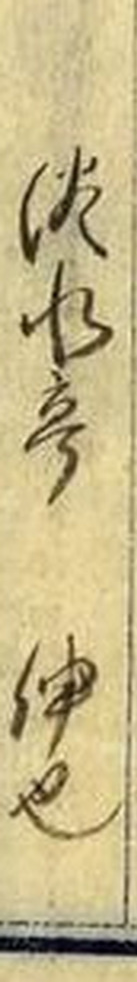淡水亭伸也
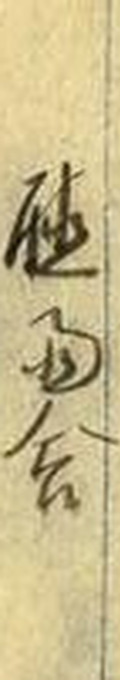聴雨舎
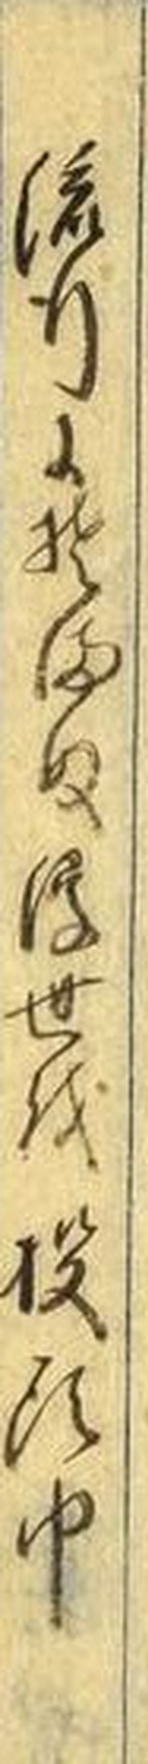流行にそまぬ浮世を投頭巾
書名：温古集 三巻
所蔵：福井県文書館 Fukui Prefectural Archives
